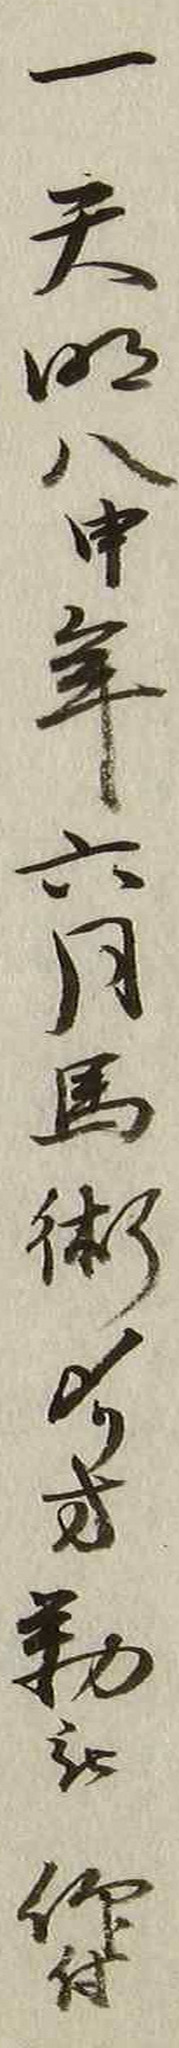一天明八申年六月馬術〆り方勤被仰付
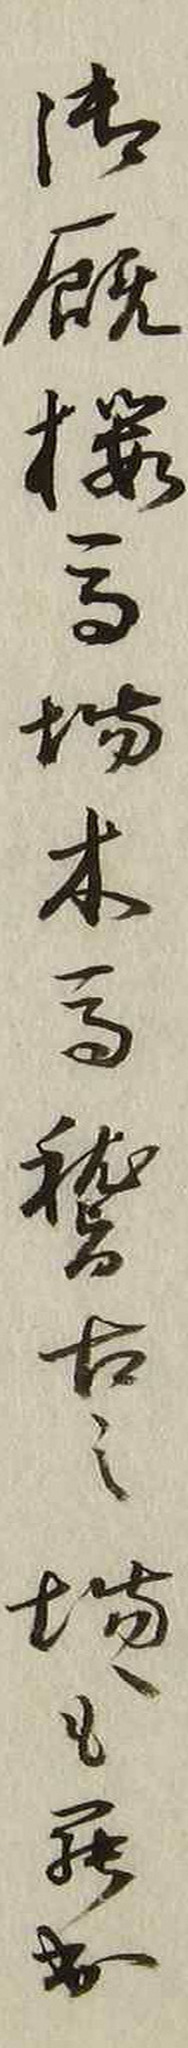御厩櫻馬場木馬稽古之場へも罷出
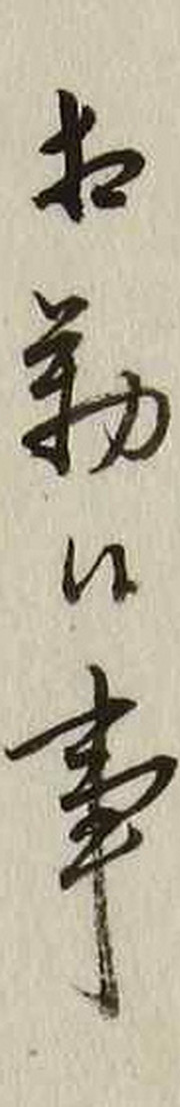相勤候事
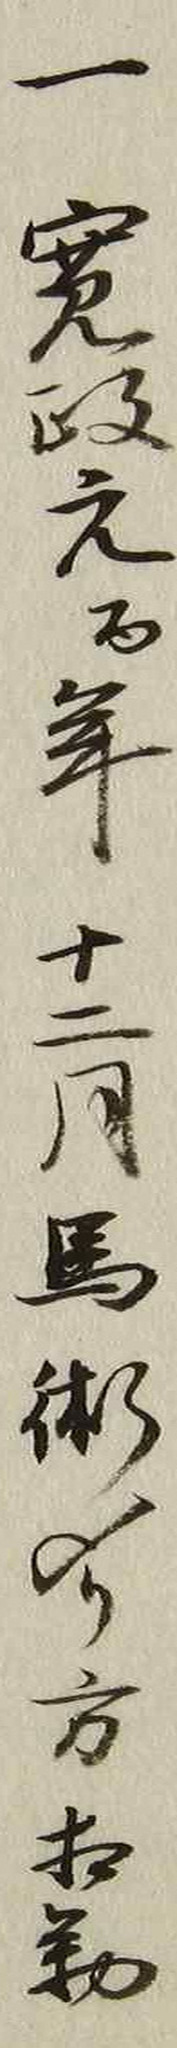一寛政元酉年十二月馬術〆り方相勤
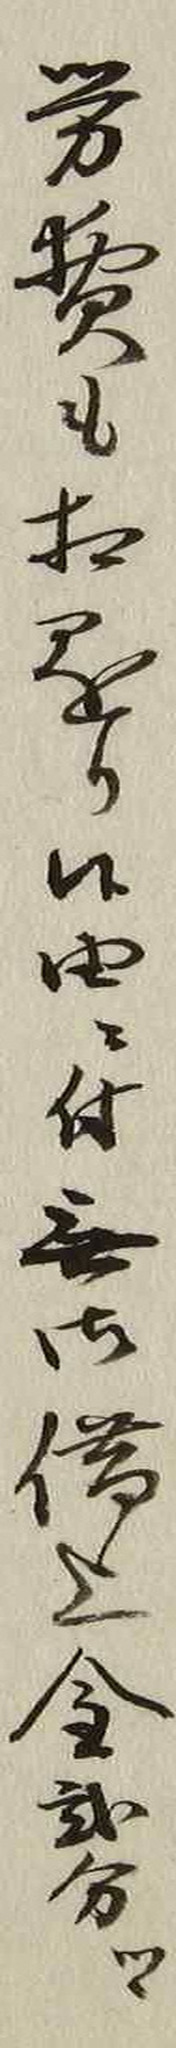労費も相懸り候由ニ付無御借上金弐分ツヽ
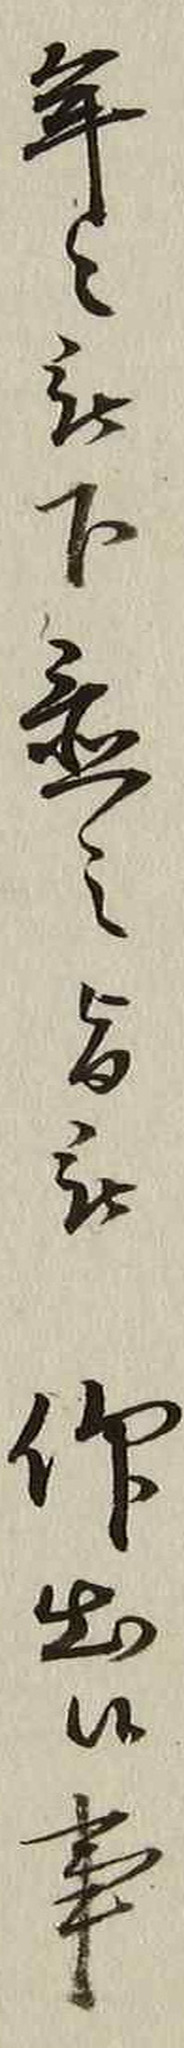年々被下置之旨被仰出候事
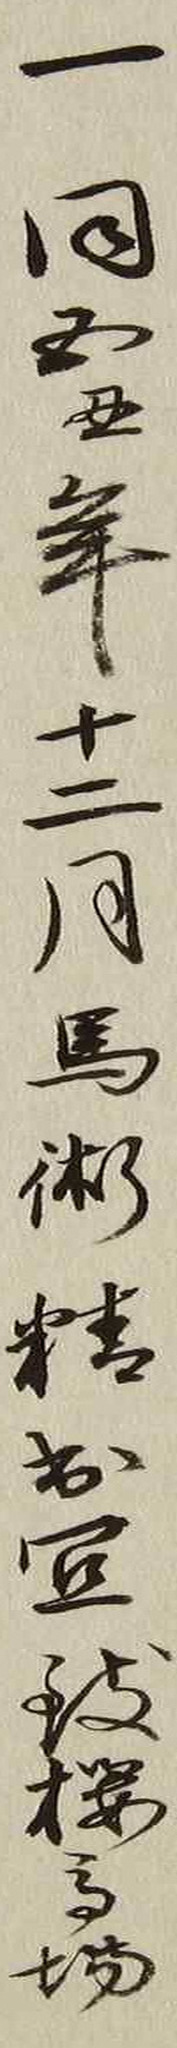一同五丑年十二月馬術精出宜致櫻馬場
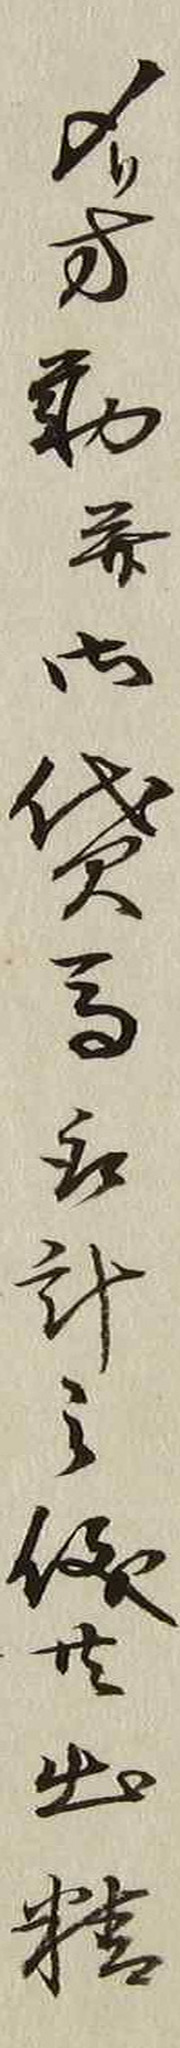〆り方勤并御貸馬取計之儀共出精
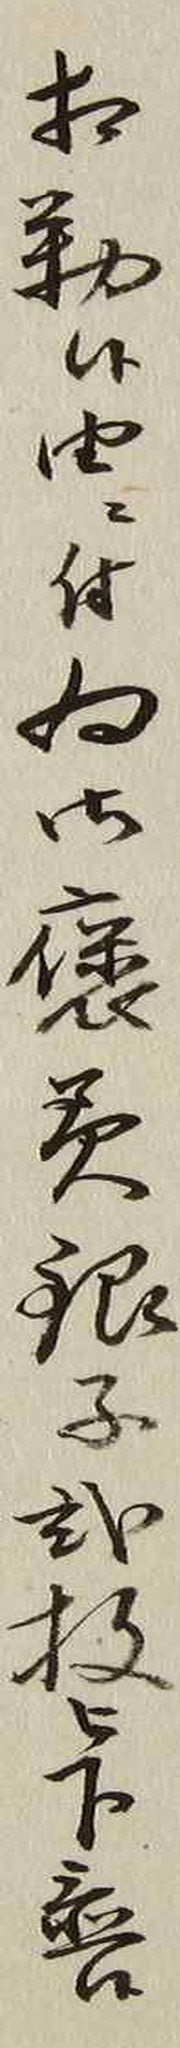相勤候由ニ付為御褒美銀子弐枚被下置候
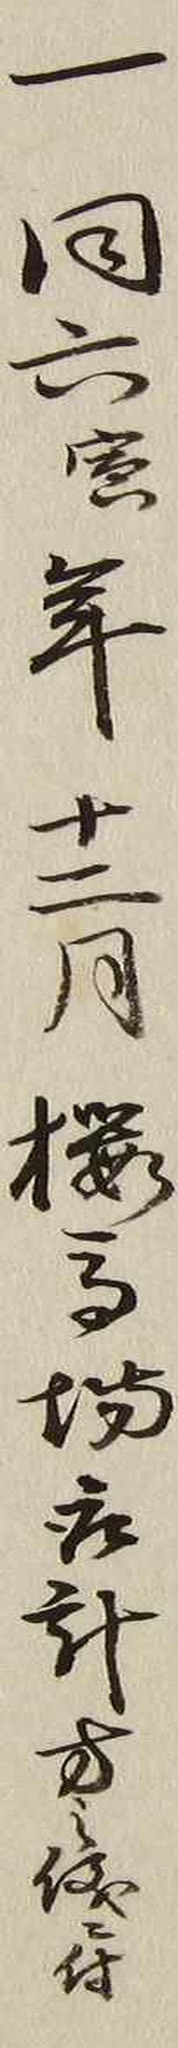一同六寅年十二月櫻馬場取計方之儀ニ付
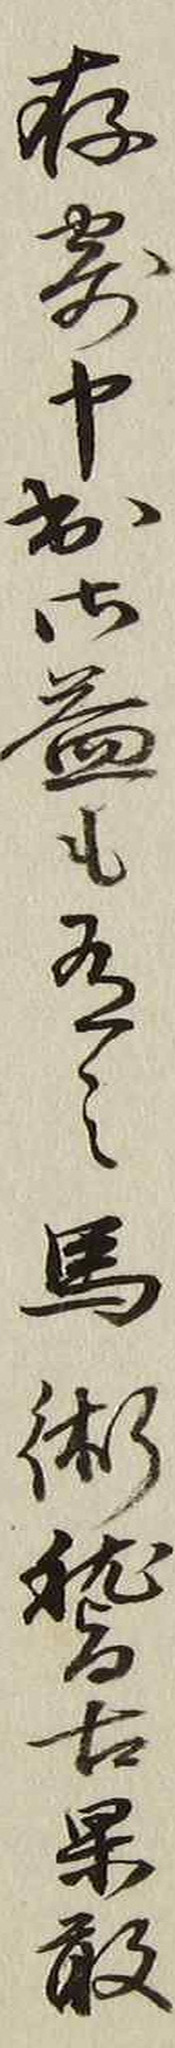存寄申出御益も有之馬術稽古果敢
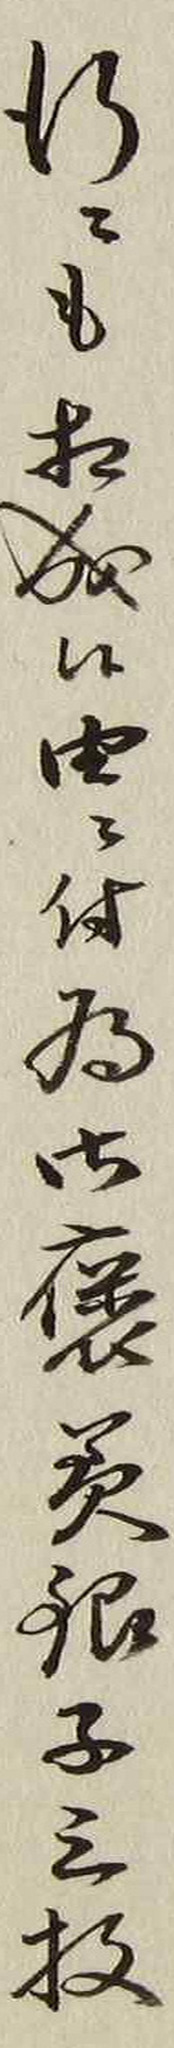行ニも相成候由ニ付為御褒美銀子三枚
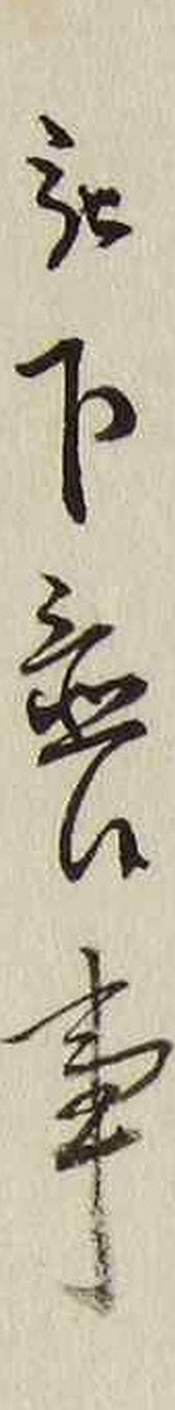被下置候事
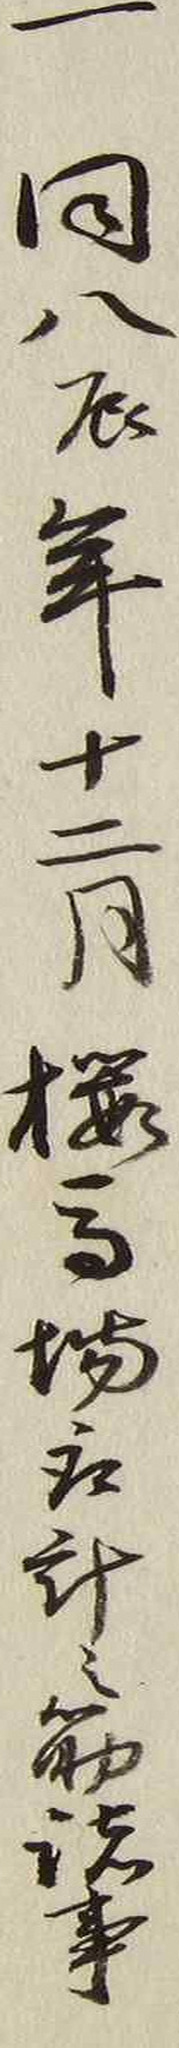一同八辰年十二月櫻馬場取計之筋諸事
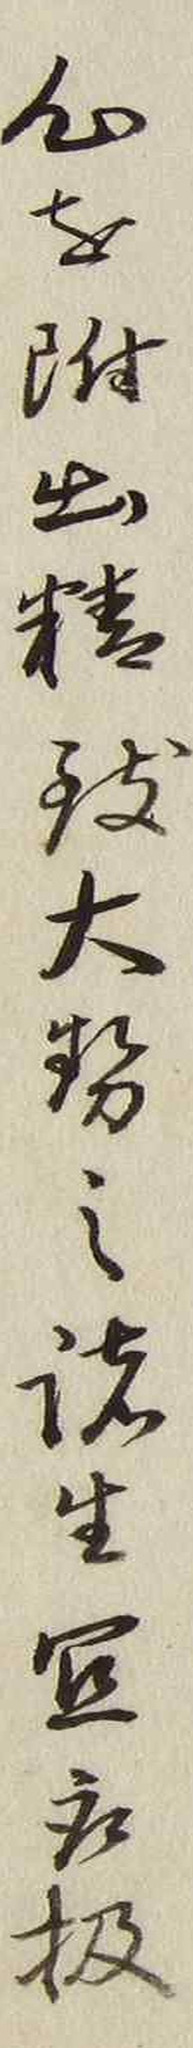心を附出精致大勢之諸生宜取扱

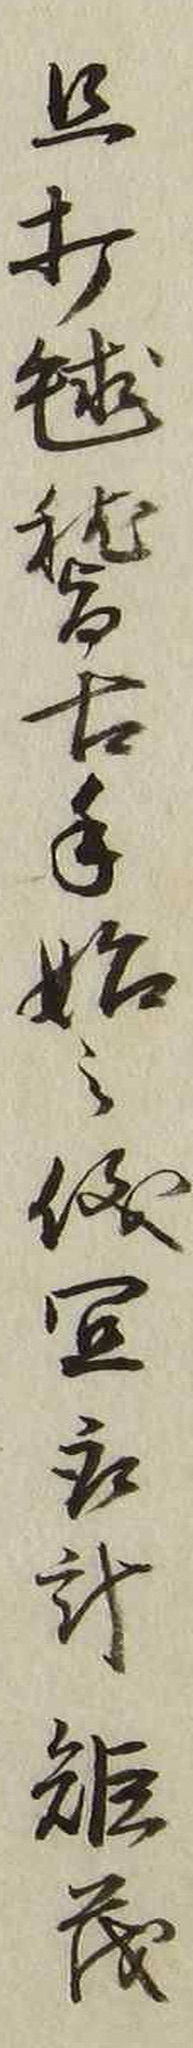且打毬稽古手始之儀宜取計矩も
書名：諸士系譜　巻之160　な之部2
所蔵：会津若松市立会津図書館
